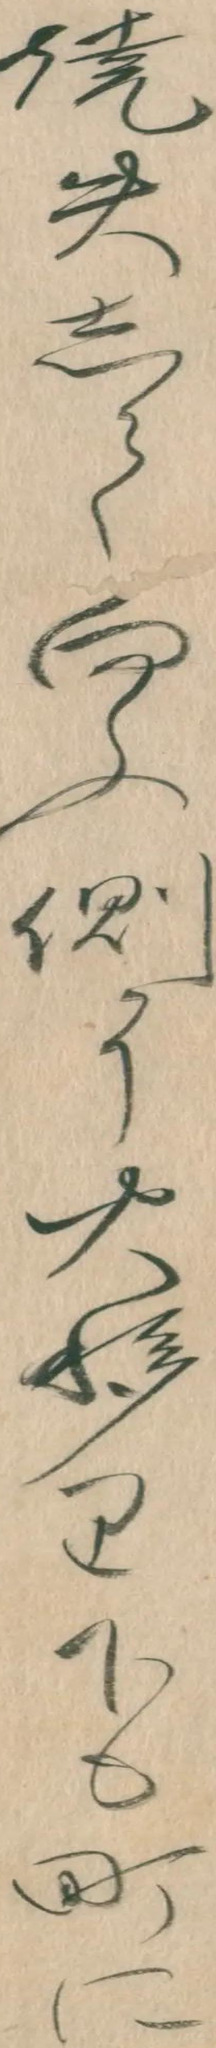焼失して向ふ側に火移り下も町に
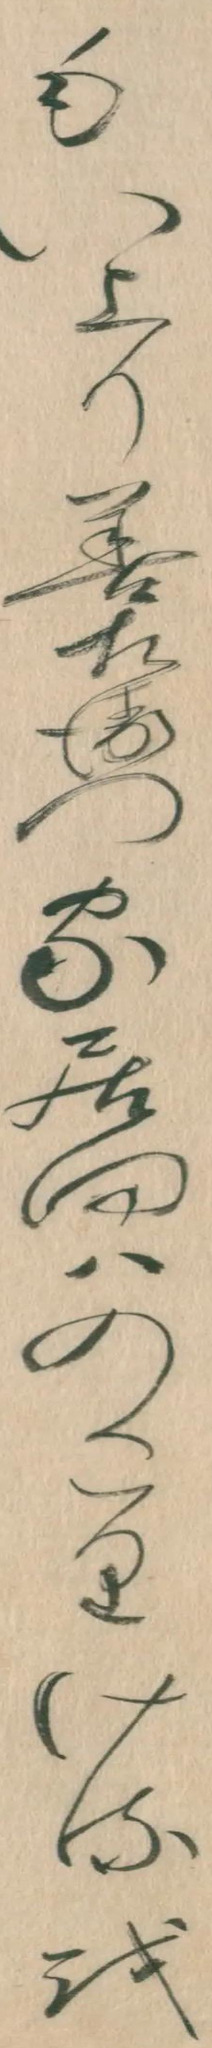もい上り善左衛門家居向はのこりけるを
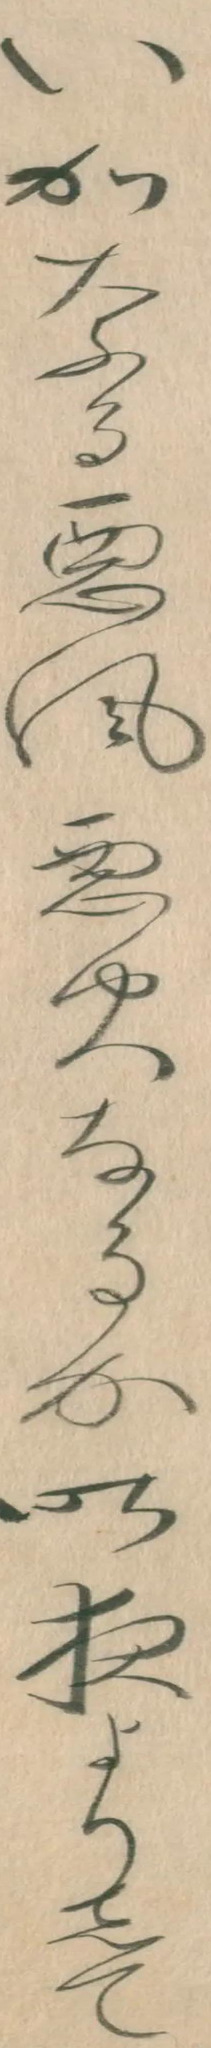いかなる悪風悪火なるか昨夜よりして
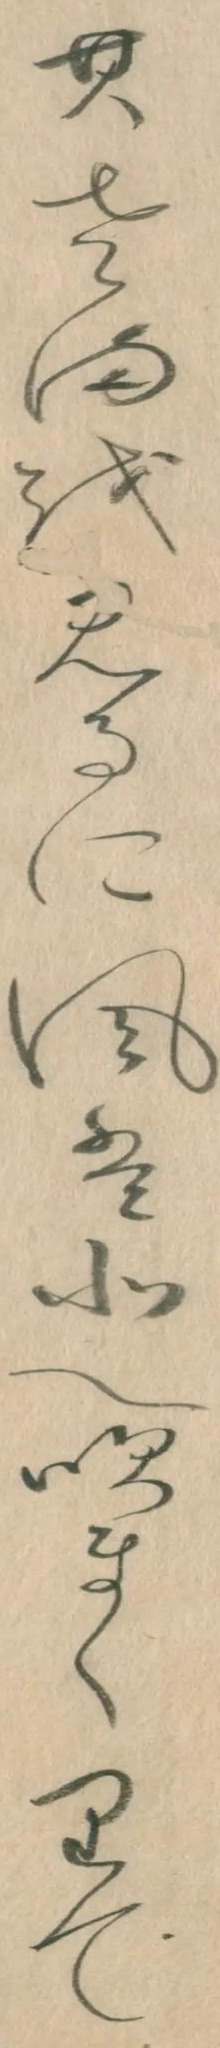其さまを見るに風は北へ吹まくりて

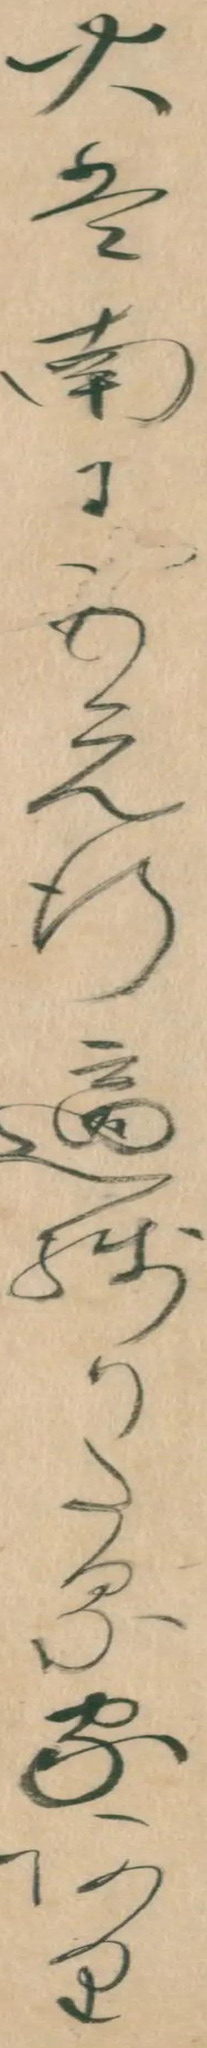火は南にもえ行適残りたる家あり
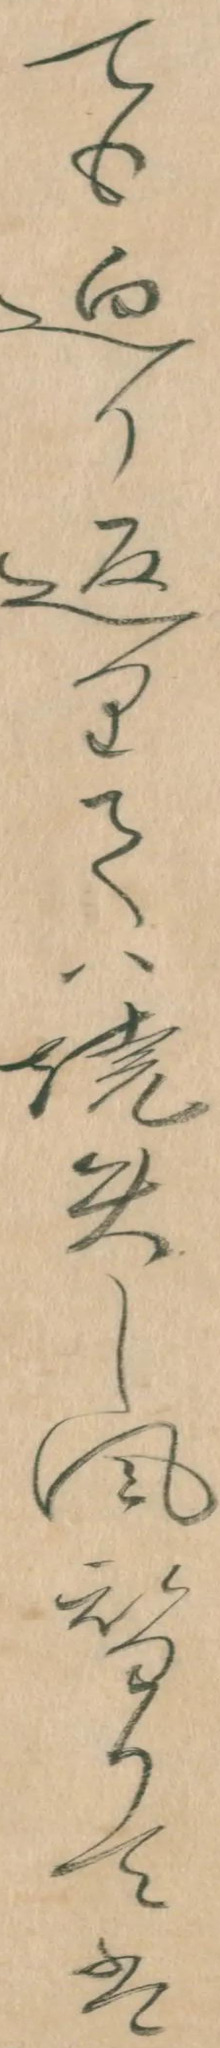ても迫り返りては焼失し風替りては
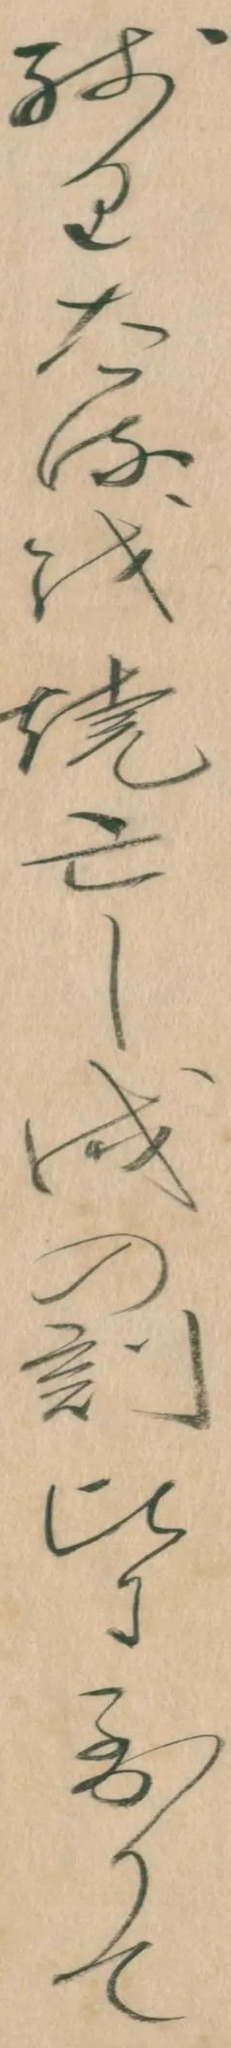残りたるを焼亡し戌の刻比に到りて
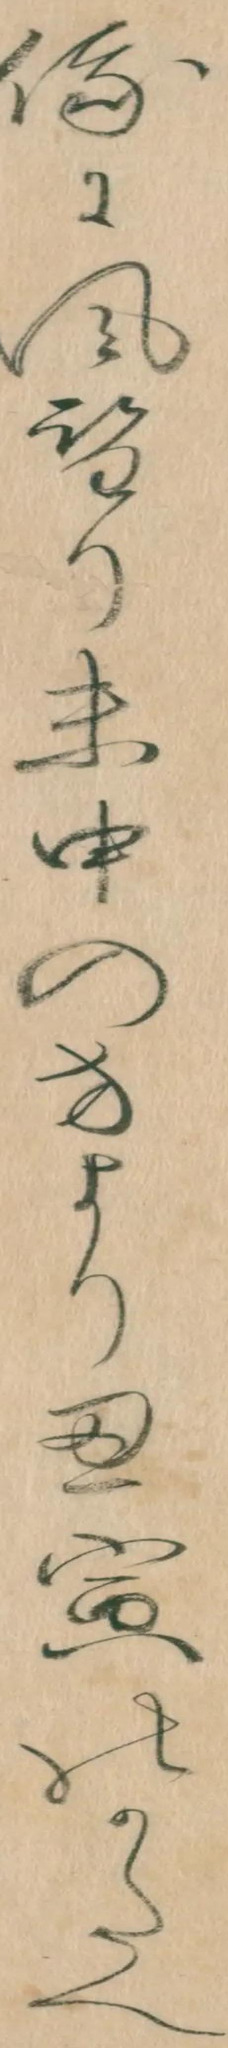俄に風替り未申の方より丑寅のかたへ
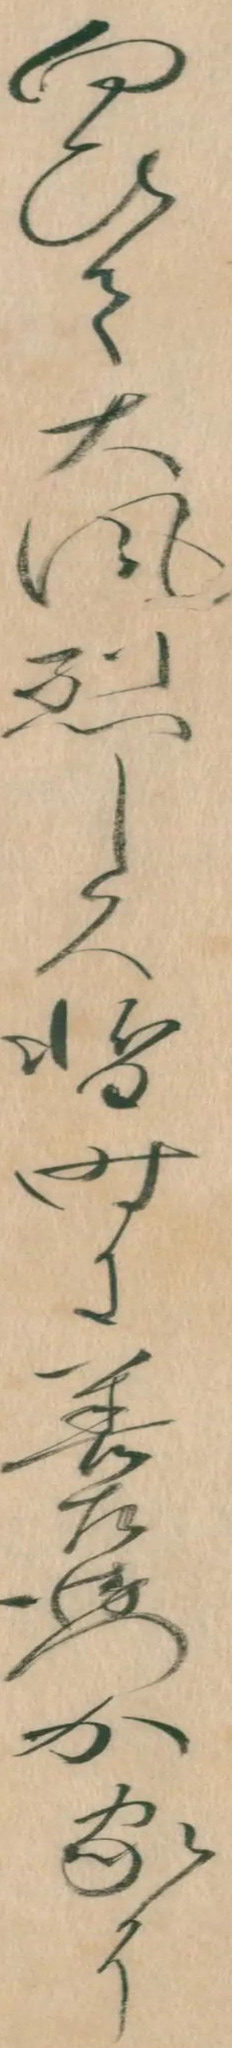向ひて大風烈しく暫時に善左衛門か家に
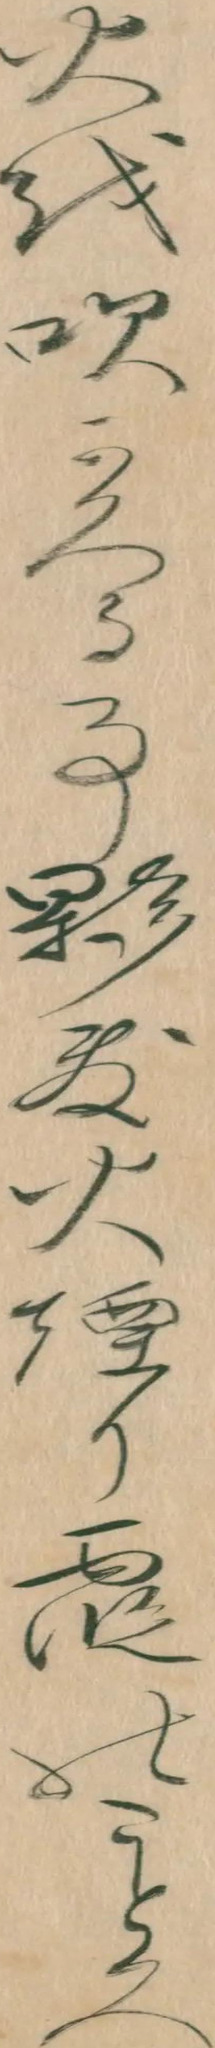火を吹かくる事夥敷火煙り霞のことく
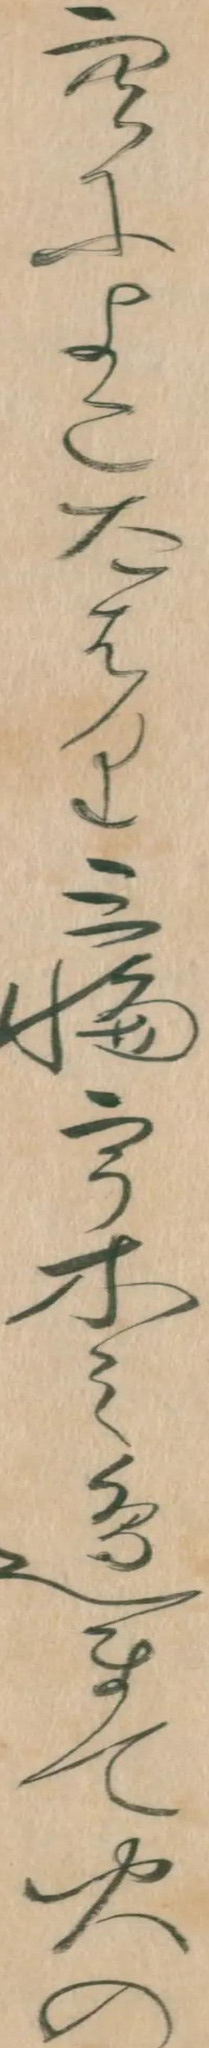空によこたはり三輪宇木之辺まて火の
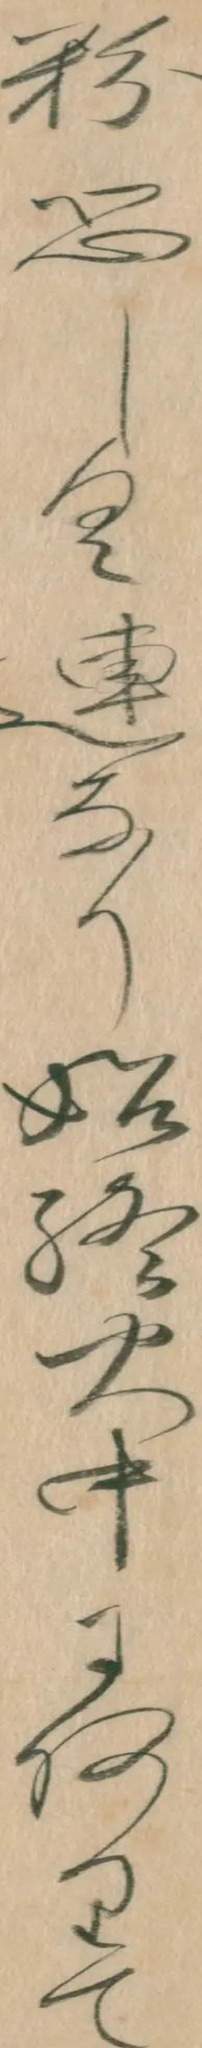粉恐しく連なり始終火中にありて
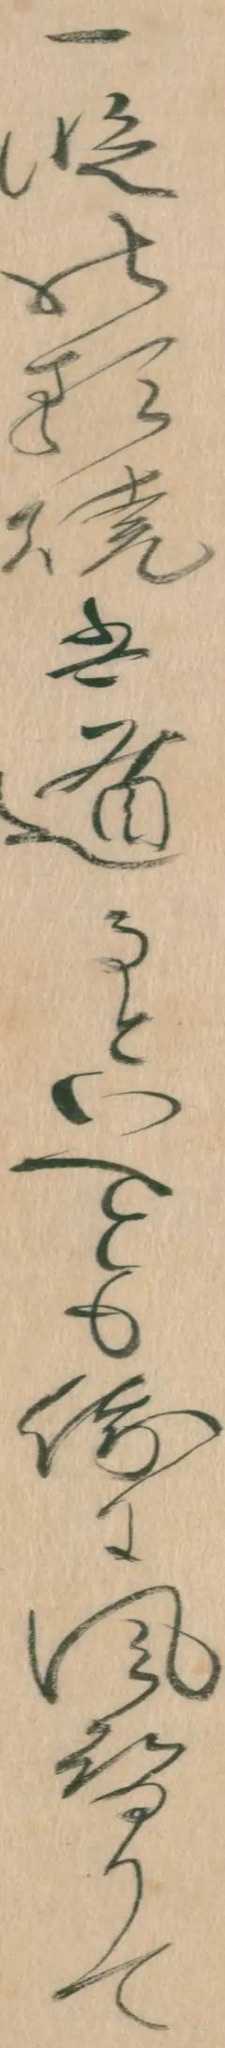一段の類焼は遁るといへとも俄に風替りて
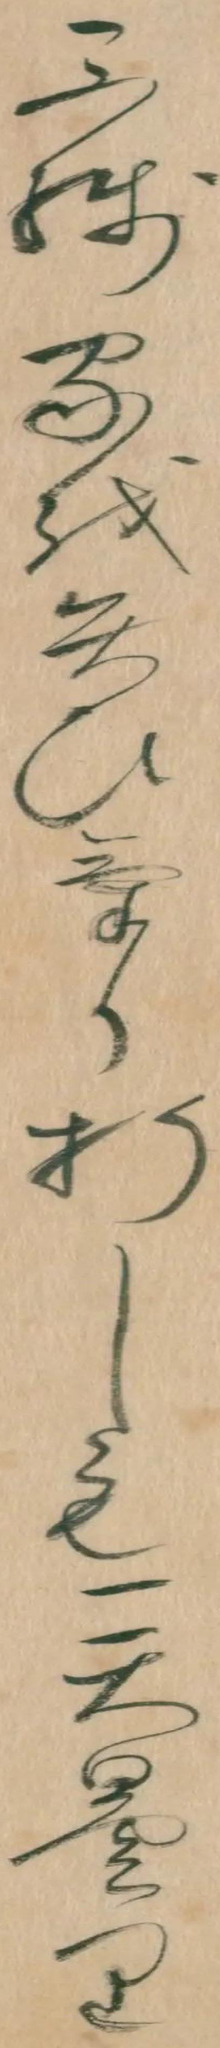不残り家を失ひけり折しも一天曇り
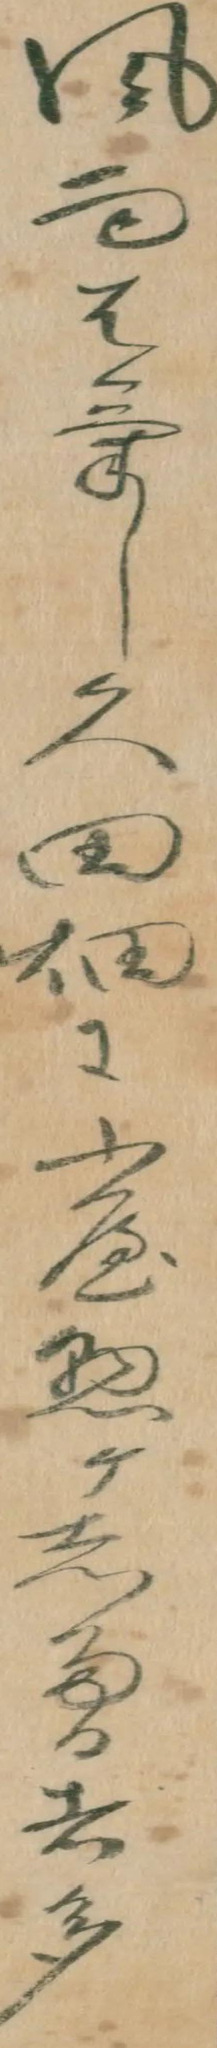風雨はけしく田畑に小屋懸ケしたる者多
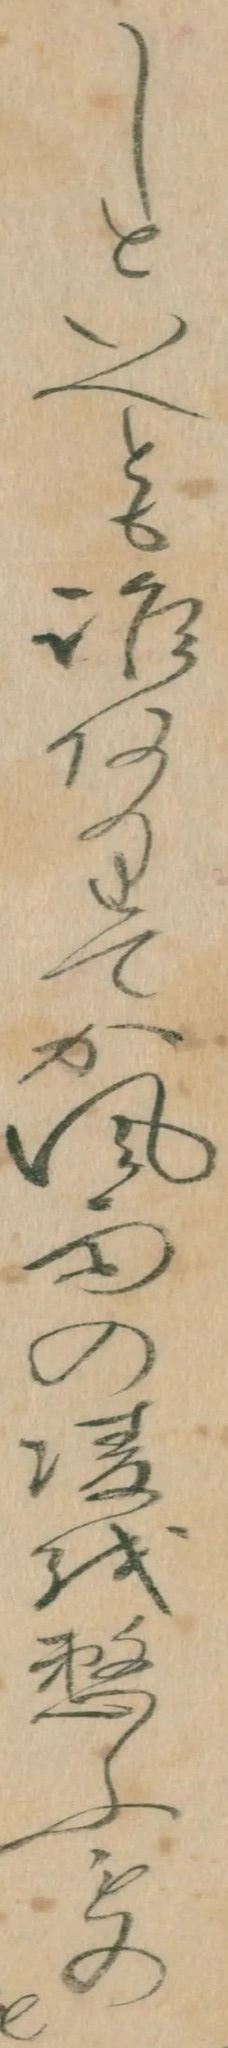しといへとも誰ありてか風雨の凌を整ふものも
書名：俗語之種. [4]
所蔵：国立国会図書館 National Diet Library, JAPAN
